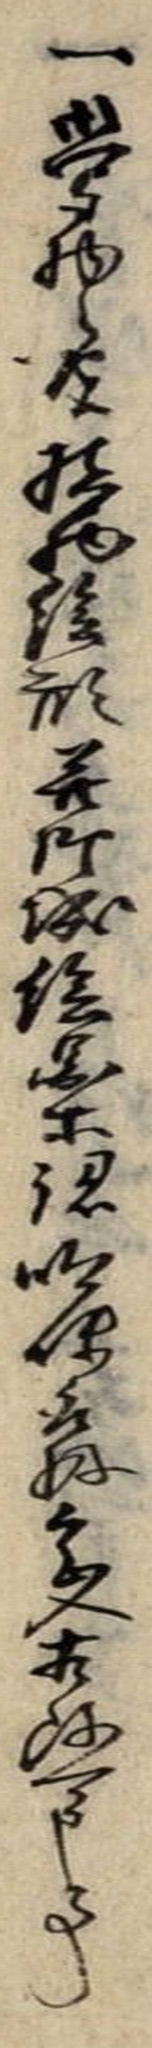一御写物之儀は指物絵形并御城絵圖等認吟味取扱念入相改可申候事
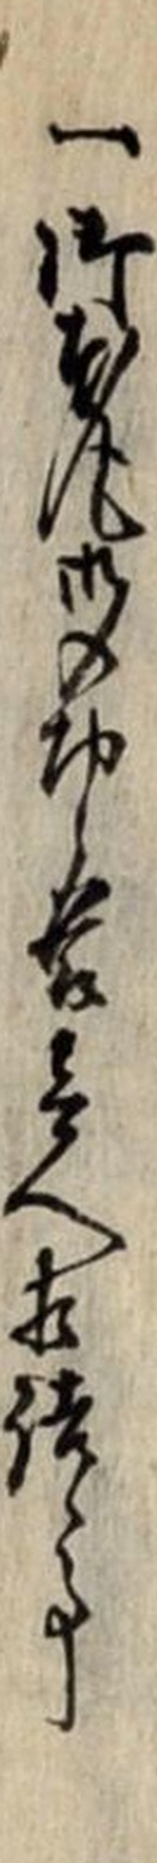一御本丸御〆切之節壱人相詰候事
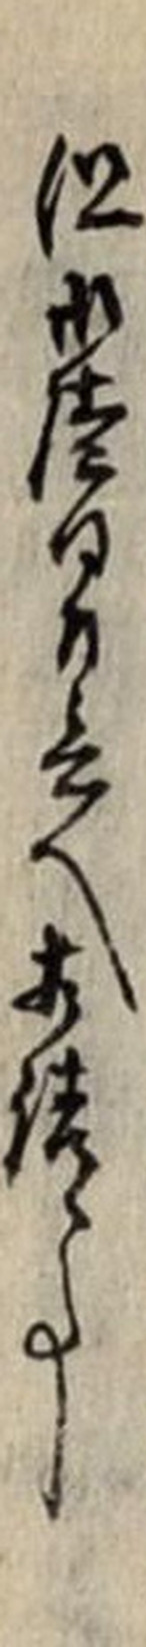但御徒目付壱人相詰候事
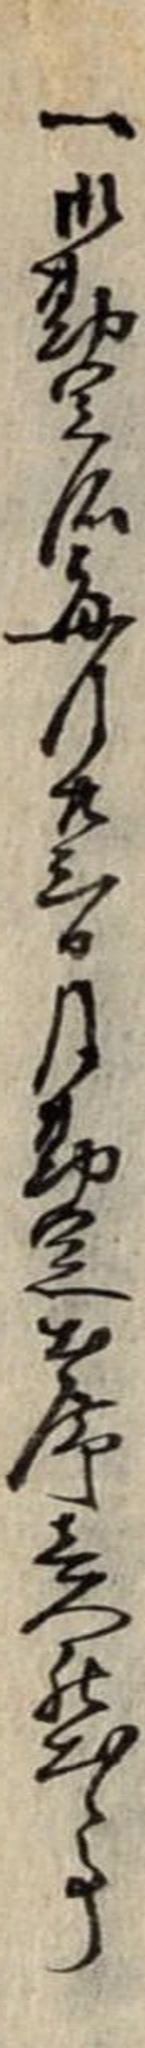一御勘定所毎月廿三日月勘定出席壱人出席候事
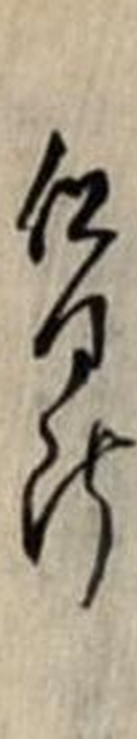但同断
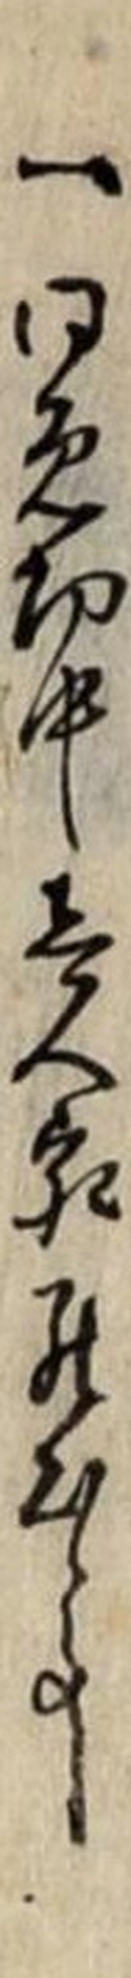一同免切中壱人宛罷出候事
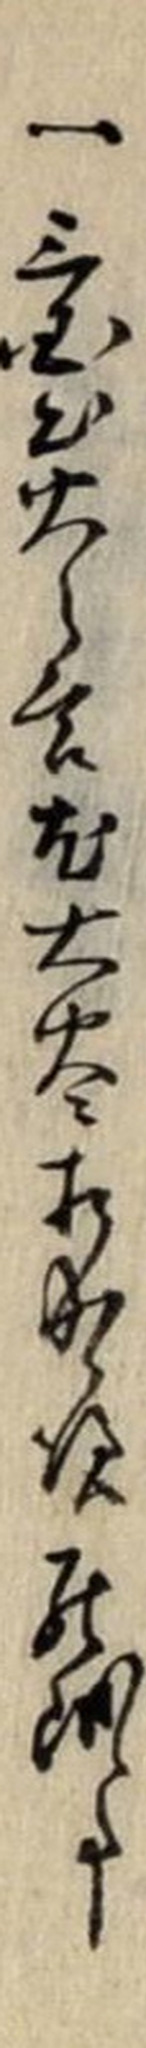一三国出火之節尤大火に相成候得は罷越候事
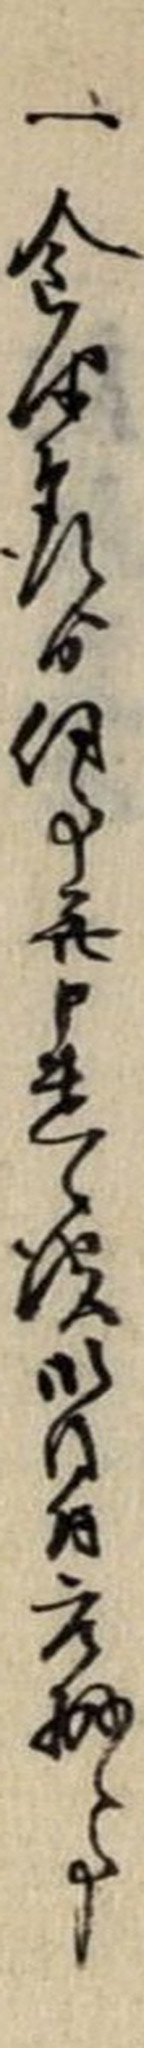一金津奉行ゟ伺事并申遣候儀は御目付取扱候事
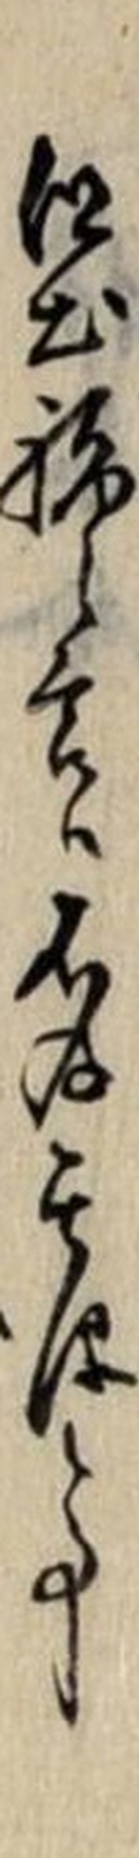但出旅之節は不及其儀候事
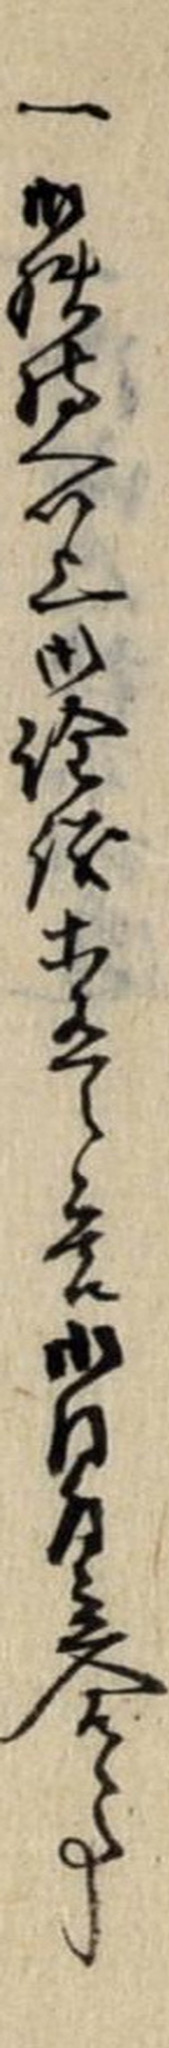一御扶持人以上御詮議等有之候節御目付立会候事
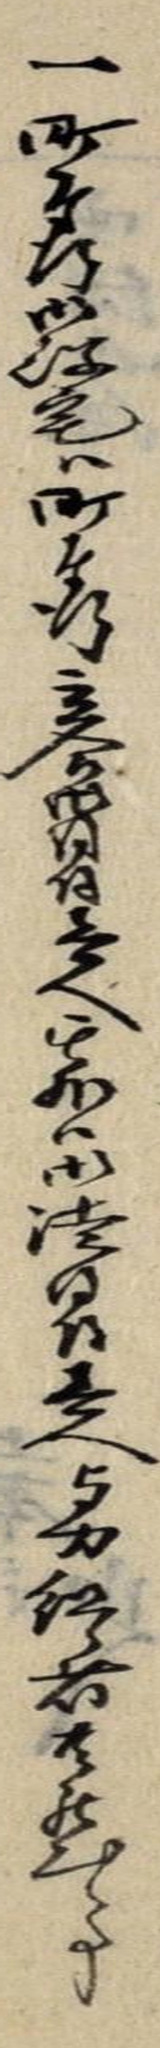一町奉行御役宅は町奉行立合御目付壱人其外は御徒目付壱人与力組之者共罷出候事
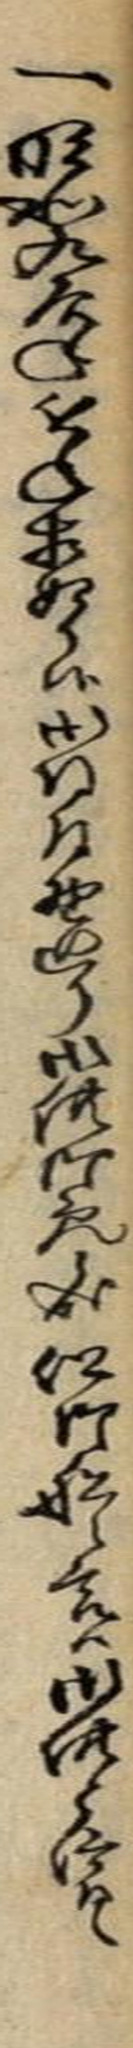一明和九辰年近年相好候御目付野廻り御供御免被成但御船之節は御供被仰付候
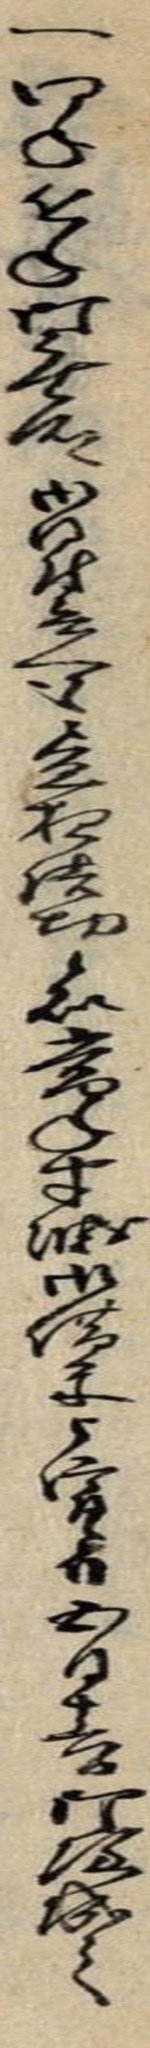一同年近年御座所へ御目付壱人つゝ昼夜詰切候処当年半減御借米被仰付候に付五月十六日御帰城之
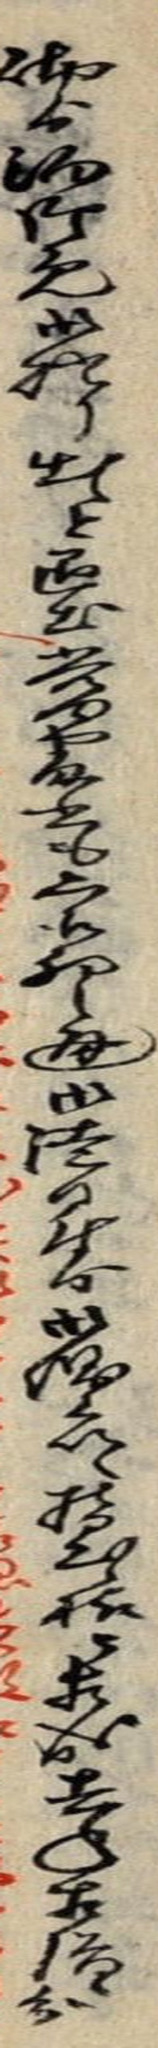砌ゟ泊御免御灯り出候迄通出当番書も最初之通御徒目付ゟ御側衆へ指出候様に相成去年相借候分
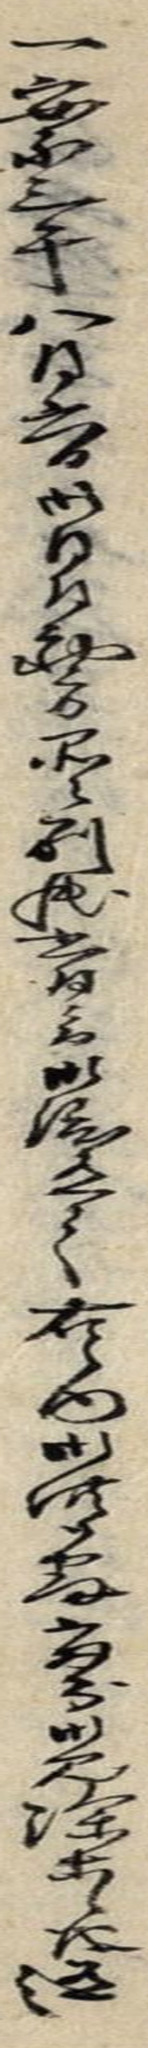一安永三午八月六日御目付勤方品々別紙書付に而御渡有之右之内御供御番当分御見除等之儀有之
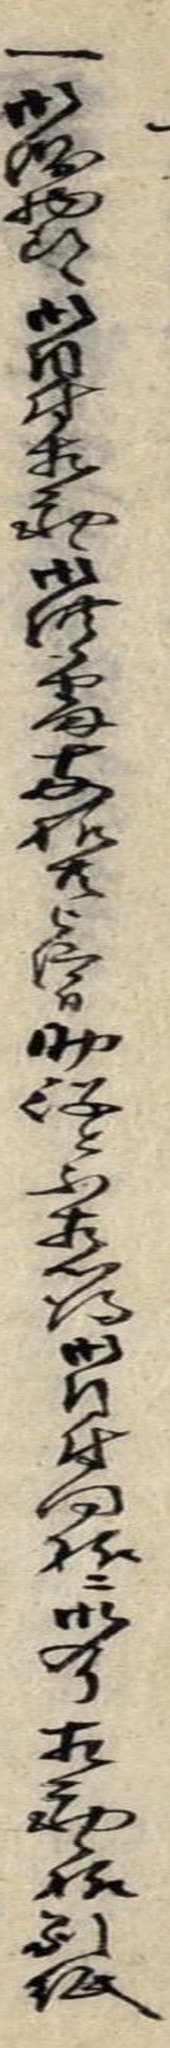一御側物頭に御目付相勤御供御番両様共被仰付助役と不相心得御目付同様に御〆り相勤候様別紙
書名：蒐輯之部
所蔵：福井県文書館 Fukui Prefectural Archives
